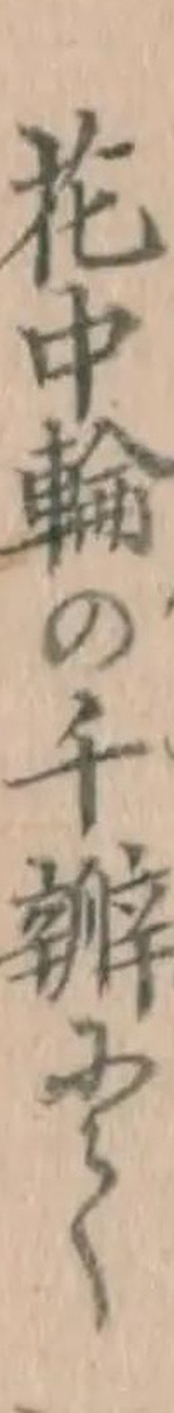花中輪の千弁にて
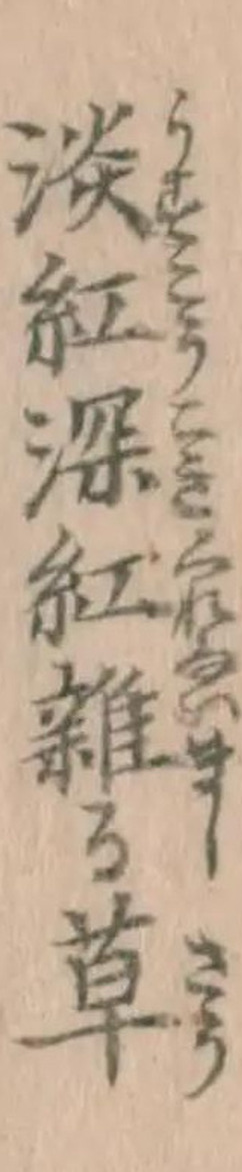淡紅深紅雑る草
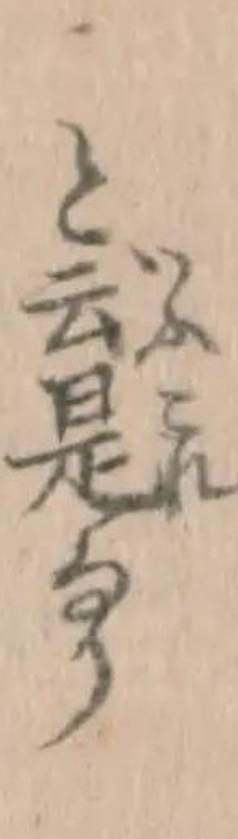と云是なり
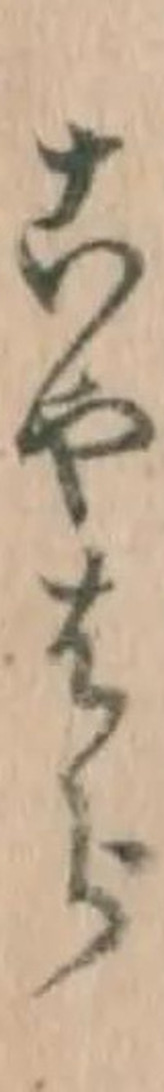こやはら

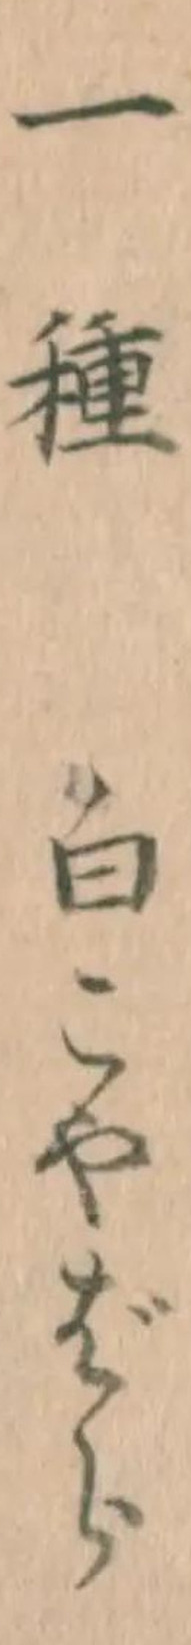一種白こやばら
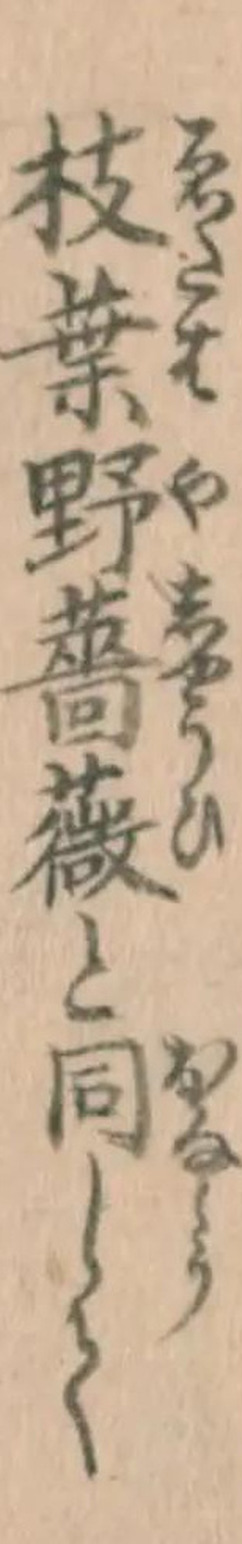枝葉野薔薇と同して
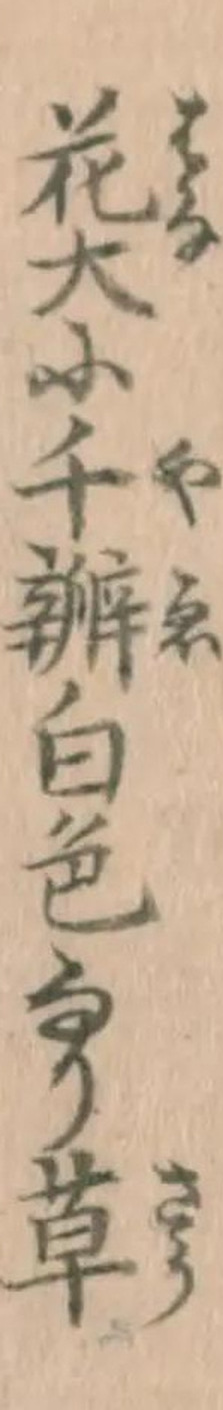花大に千弁白色なり草
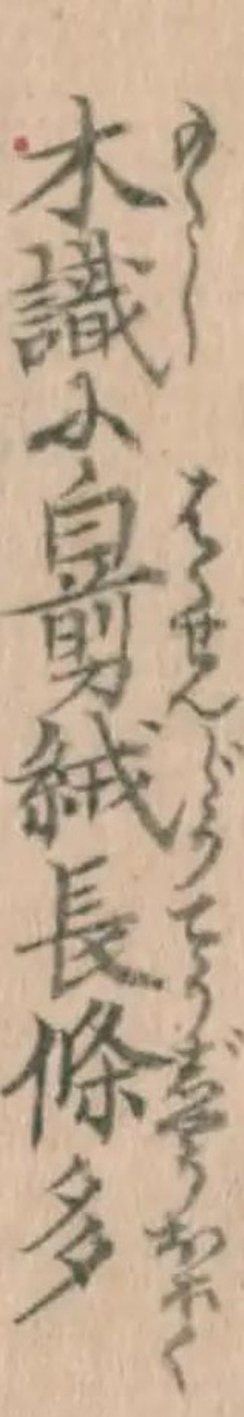木識に白剪絨長条多
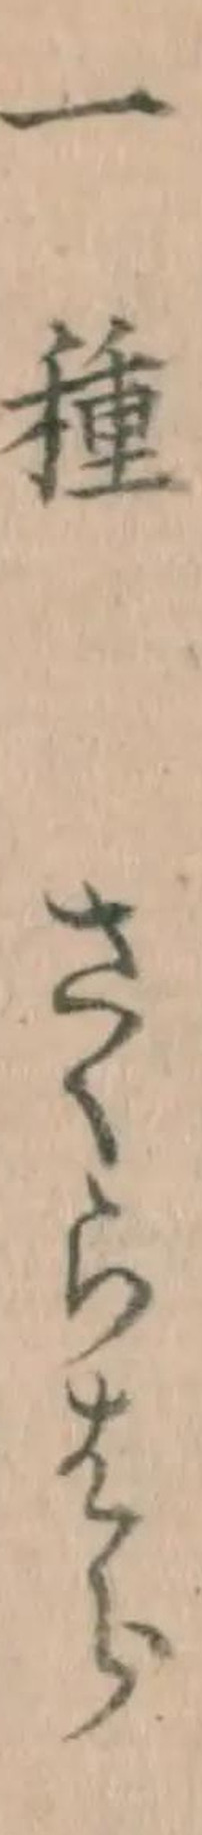一種さくらはら
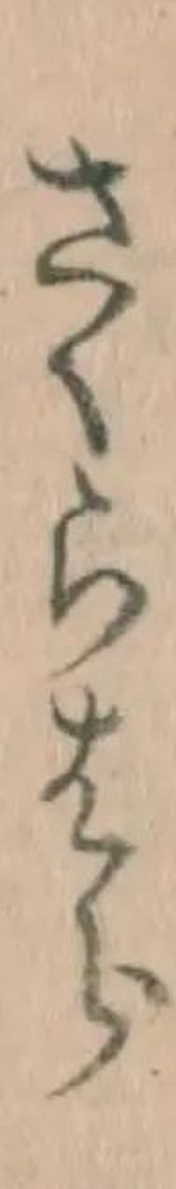さくらはら
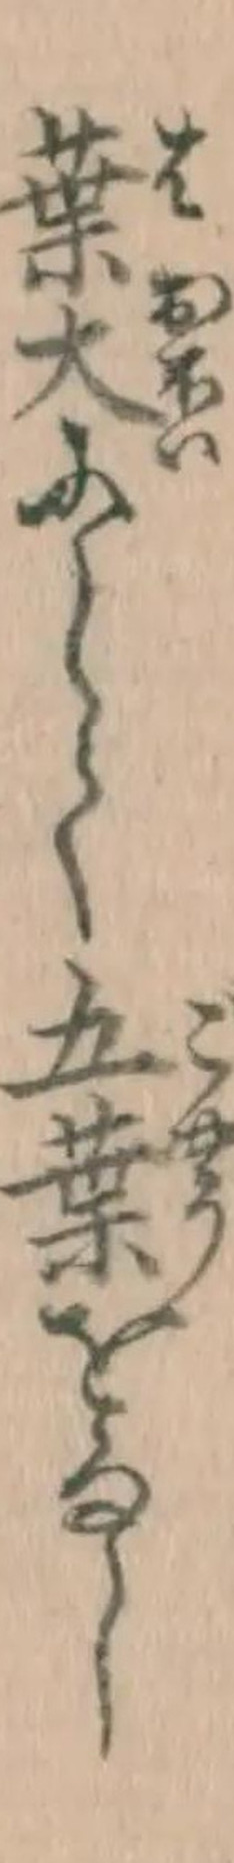葉大にして五葉をなし
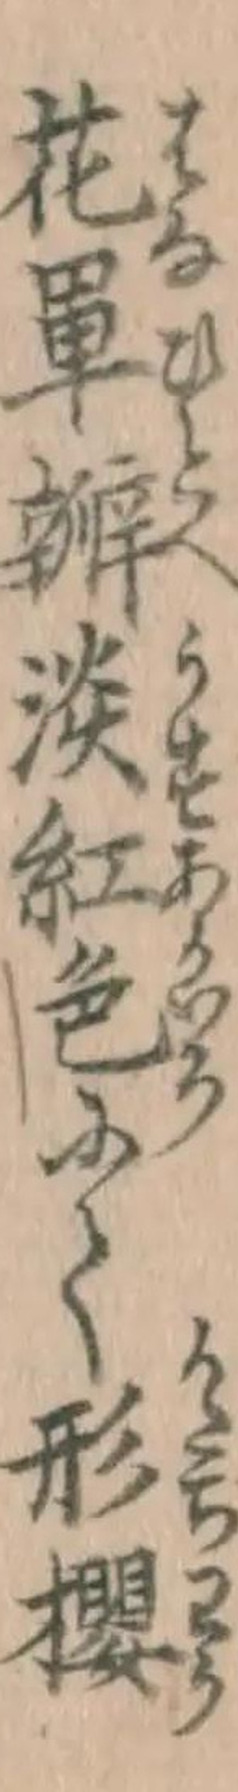花単弁淡紅色にて形桜
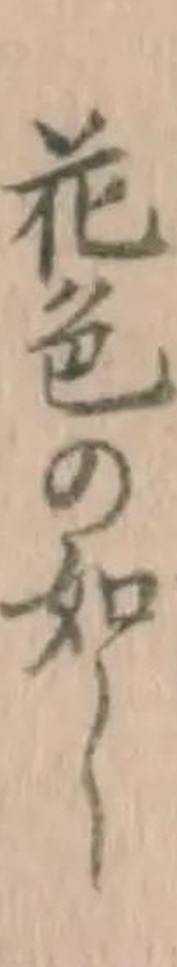花色の如し
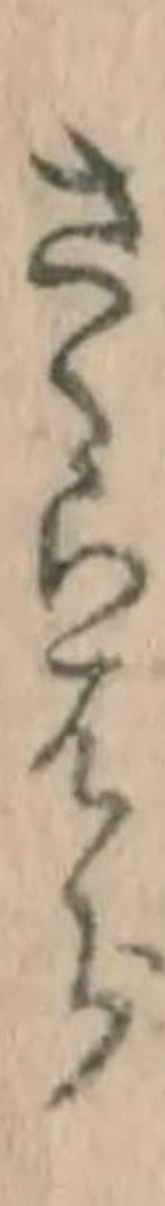さくらはら

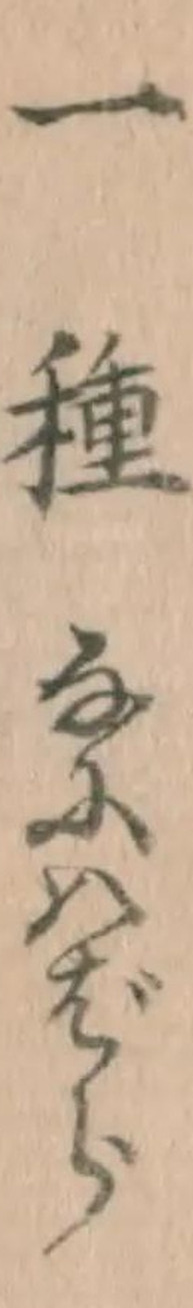一種なにはばら
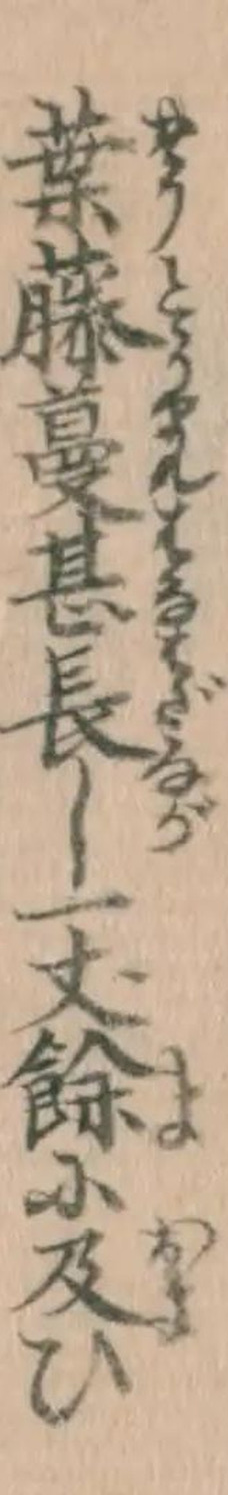葉藤蔓甚長し一丈余に及ひ
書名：本草図譜. 巻25-27
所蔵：国立国会図書館 National Diet Library, JAPAN
